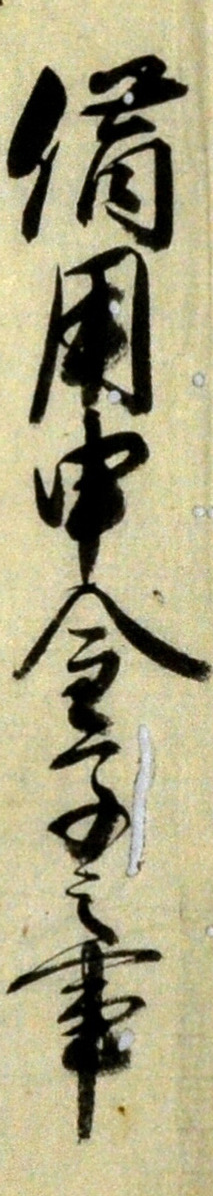借用申金子之事
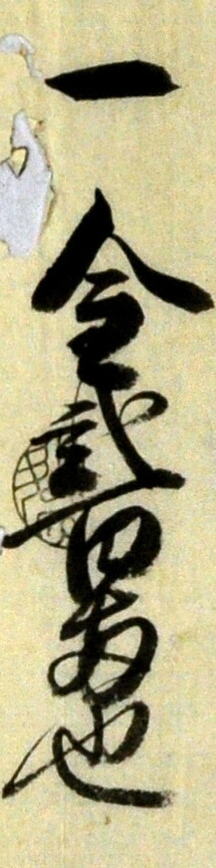一金弐百両也
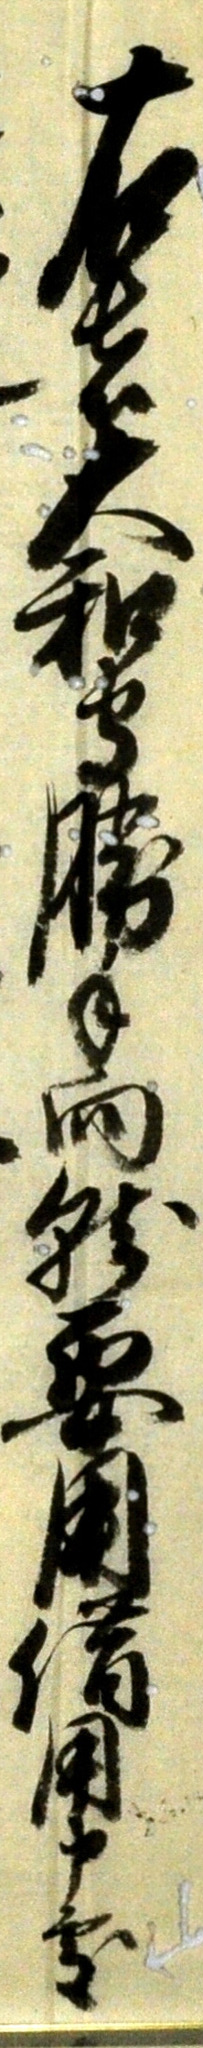右者大和守勝手向就要用借用申処
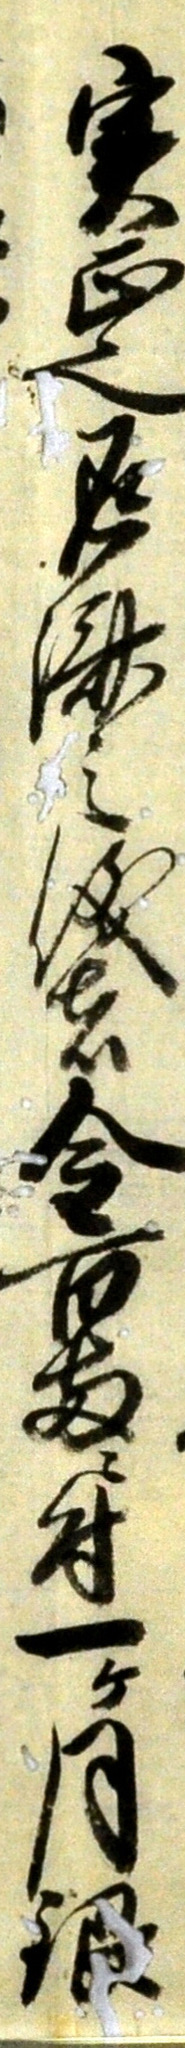実正也返済之儀者金百両ニ付一ヶ月銀
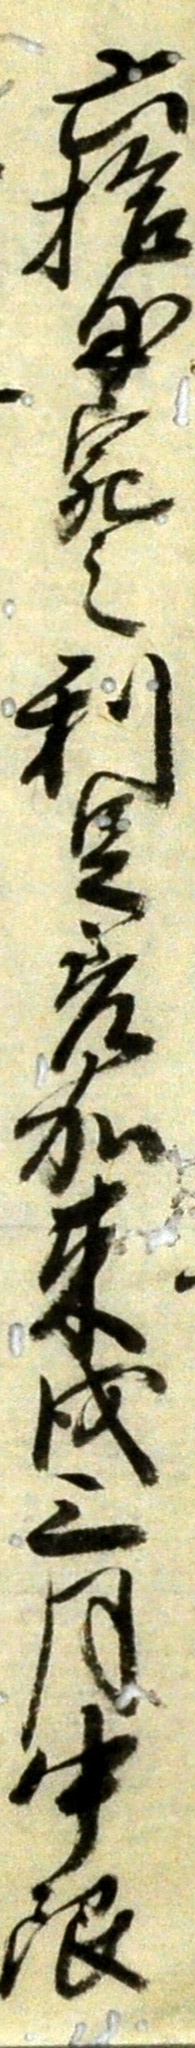六拾匁宛之利足差加来戌三月中限
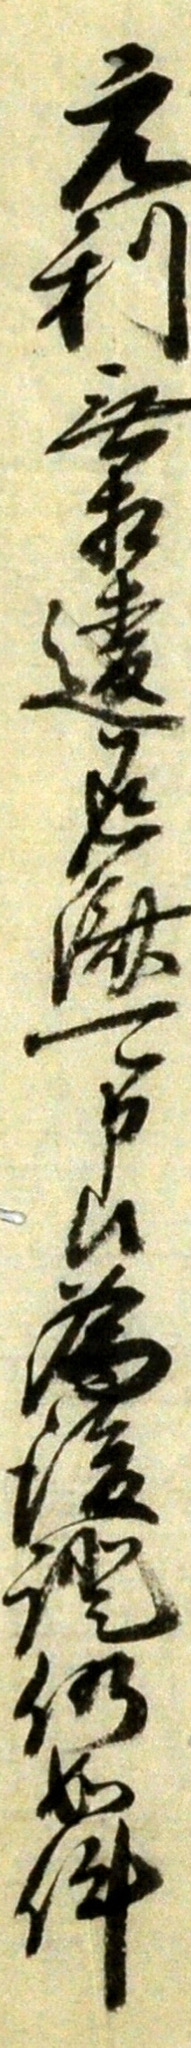元利無相違返済可申候為後証仍如件
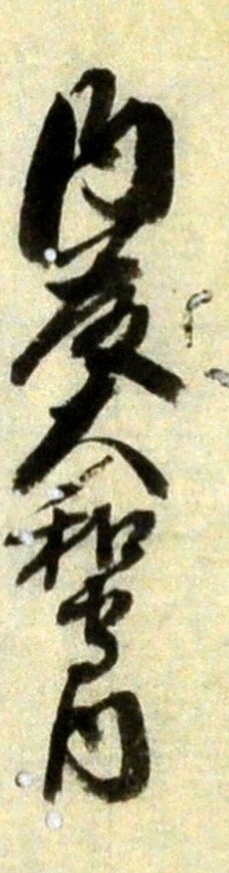内藤大和守内
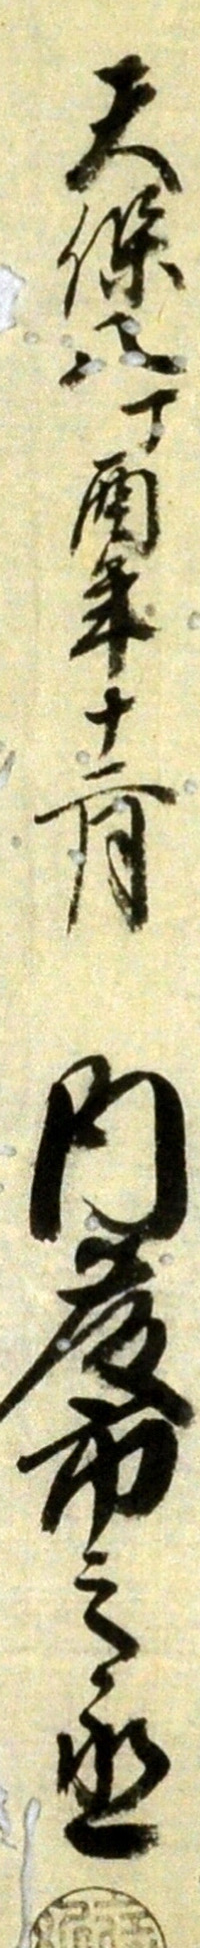天保八丁酉年十二月内藤市之丞
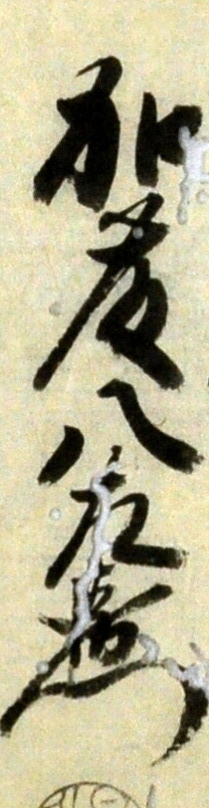加藤八左衛門
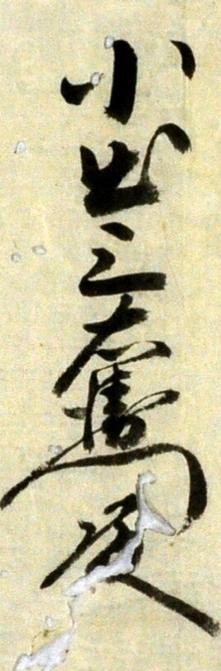小出三右衛門殿
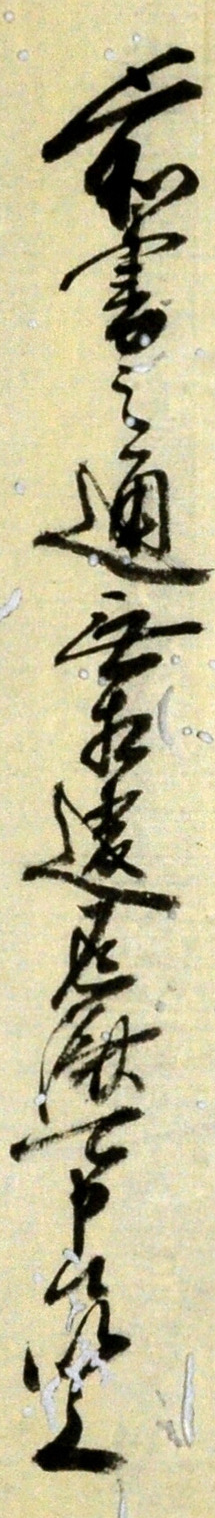前書之通無相違返済可申候以上
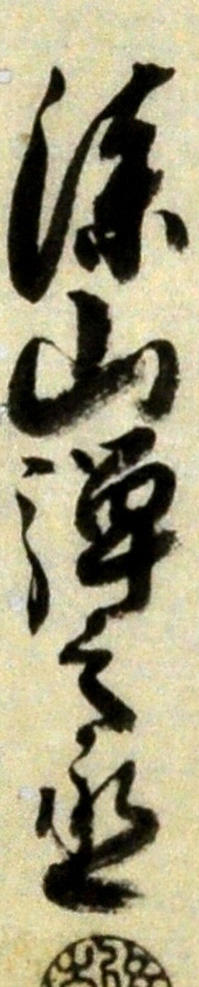深山騨之丞
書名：借用申金子之事
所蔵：伊那市立高遠町図書館・合同会社AMANE
